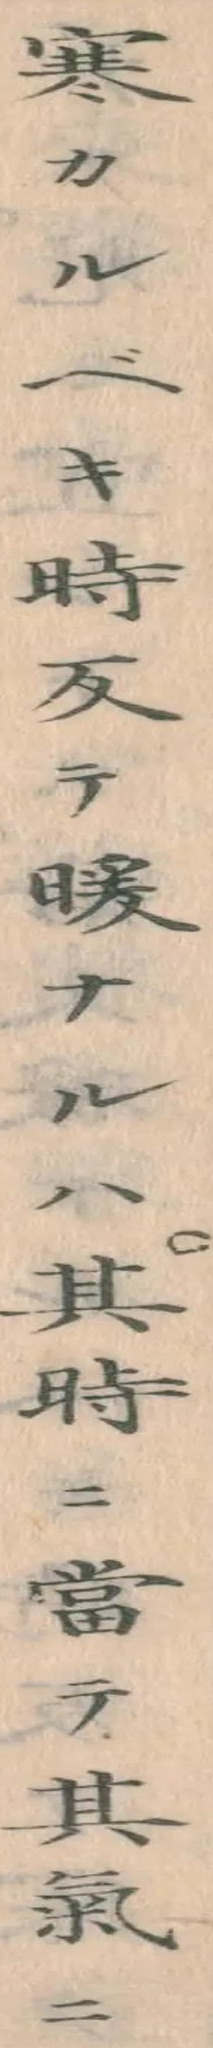寒カルベキ時反テ暖ナルハ。其時ニ当テ其気ニ
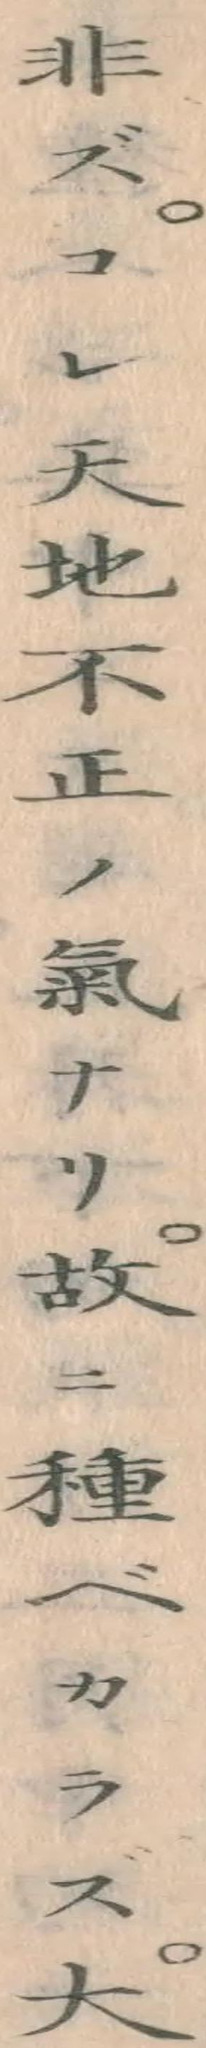非ズ。コレ天地不正ノ気ナリ。故ニ種ベカラス。大
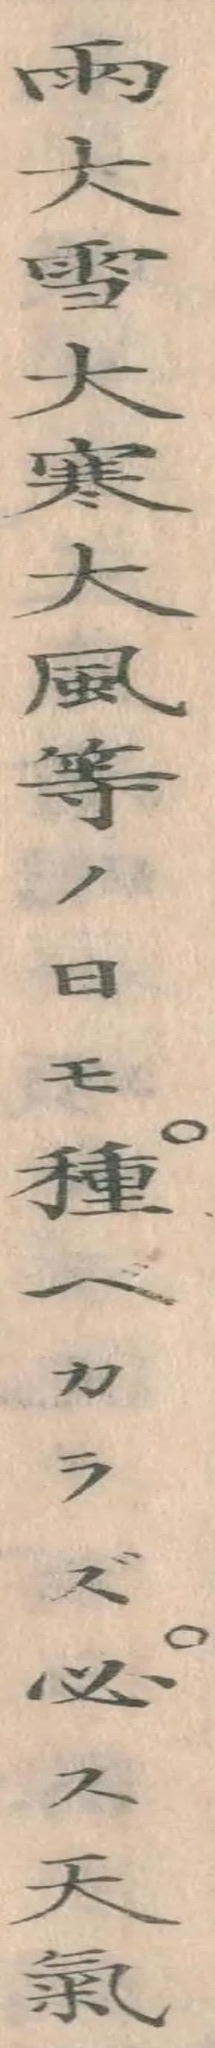雨大雪大寒大風等ノ日モ。種ヘカラズ。必ス天気
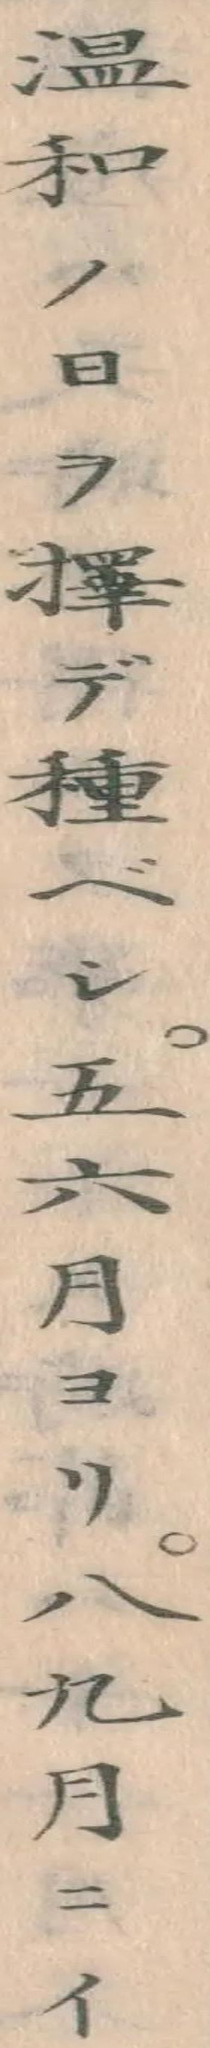温和ノ日ヲ択デ種ベシ。五六月ヨリ。八九月ニイ
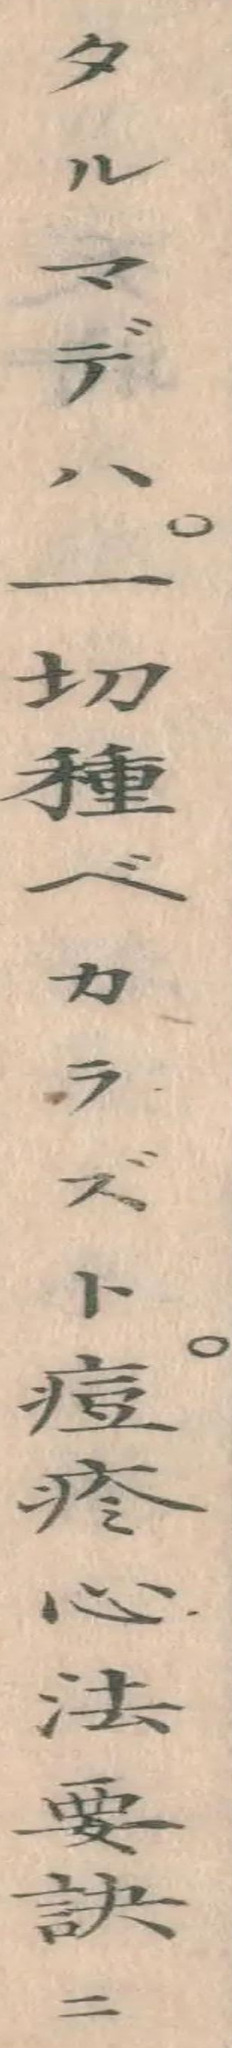タルマデハ。一切種ベカラズト。痘疹心法要訣ニ
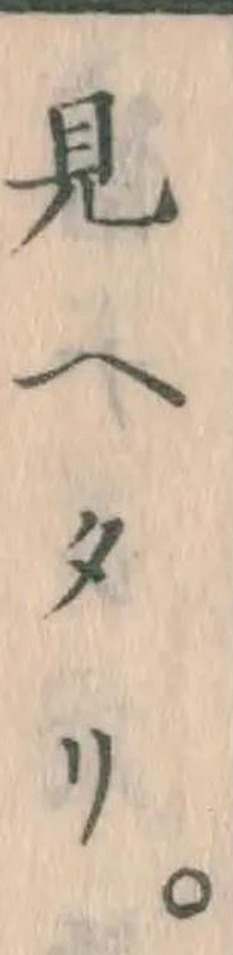見ヘタリ。
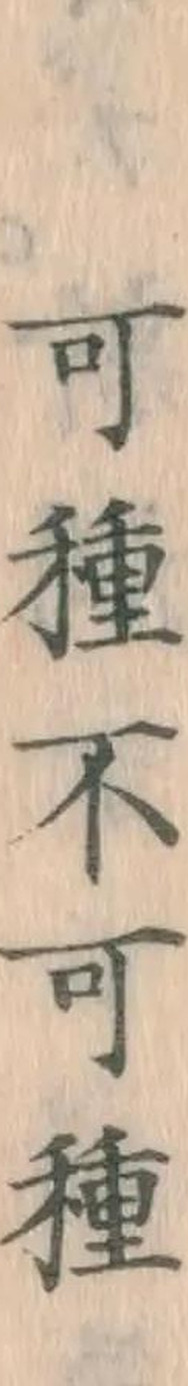可種不可種
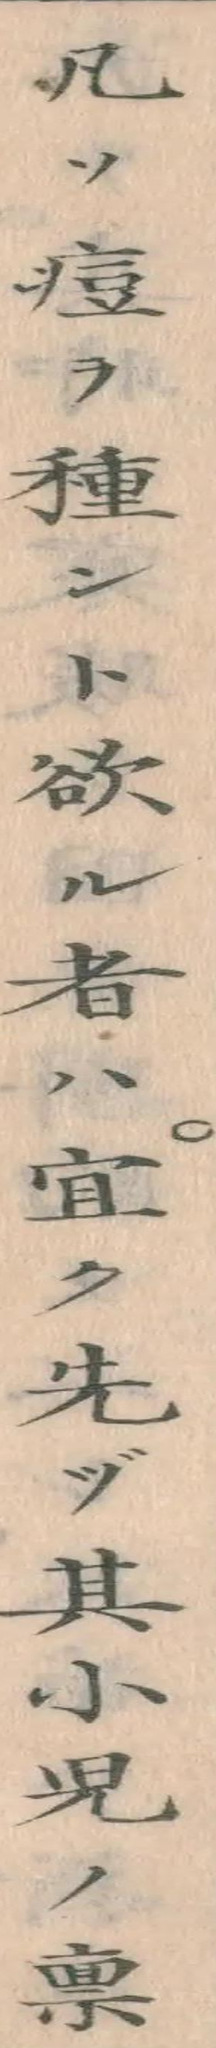凡ソ痘ヲ種ント欲ル者ハ。宜ク先ヅ其小児ノ稟
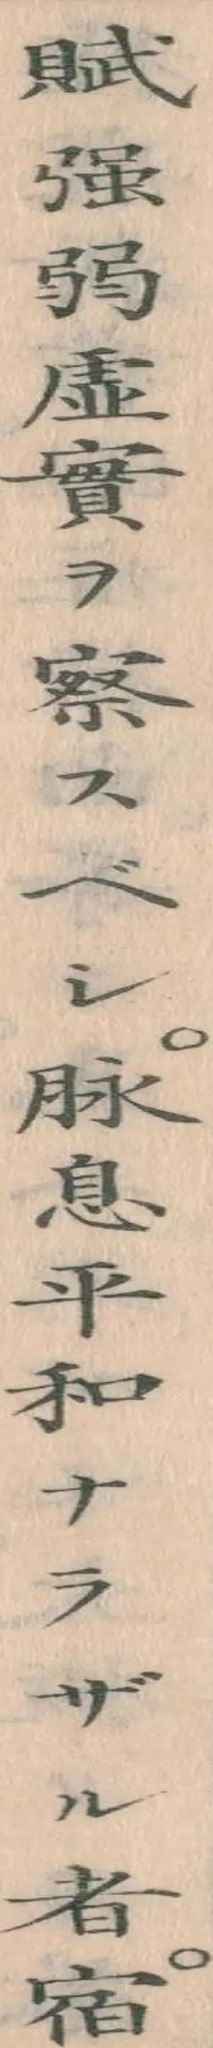賦強弱虚実ヲ察スベシ。脉息平和ナラザル者。宿
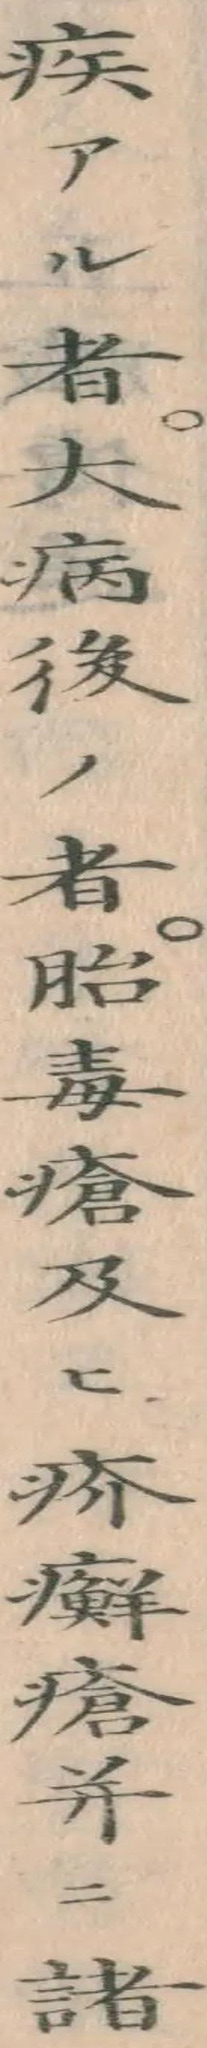疾アル者。大病後ノ者。胎毒瘡及ヒ疥癬瘡并ニ諸
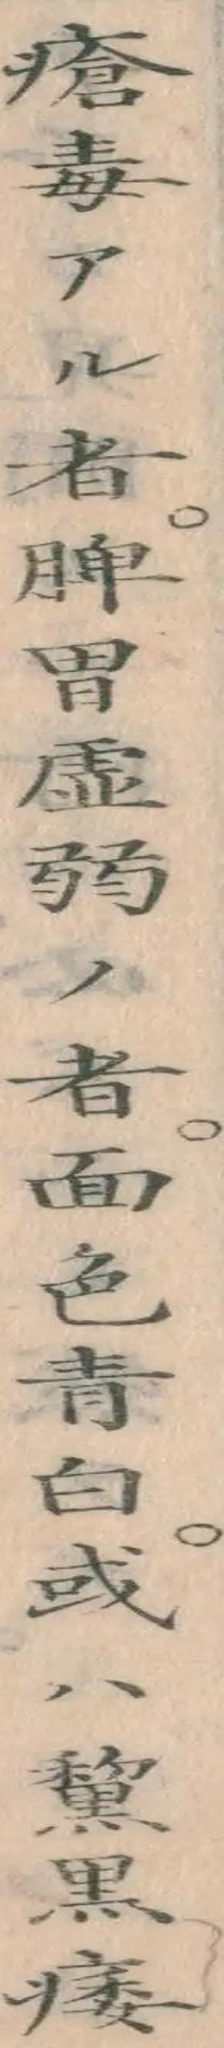瘡毒アル者。脾胃虚弱ノ者。面色青白。或ハ黧黒痿
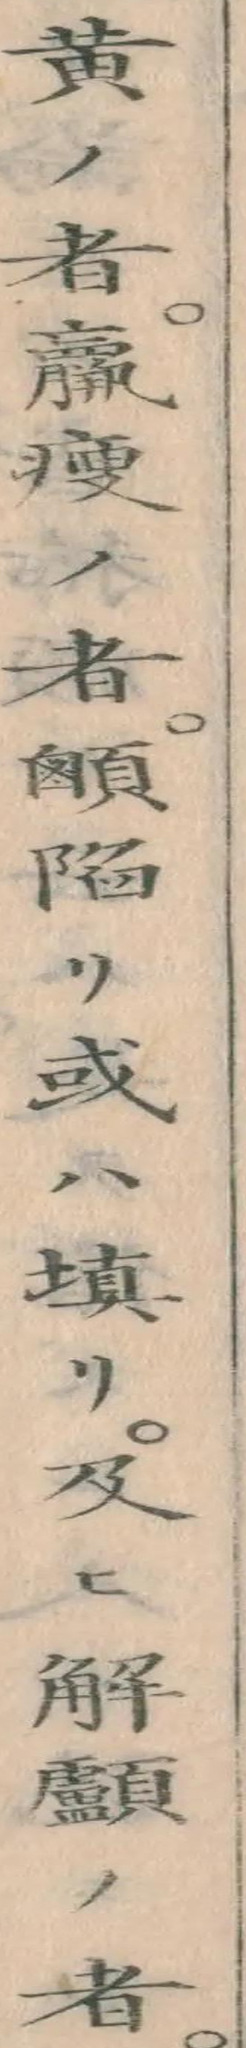黄ノ者。羸痩ノ者。顖陥リ或ハ填リ。及ヒ解顱ノ者。
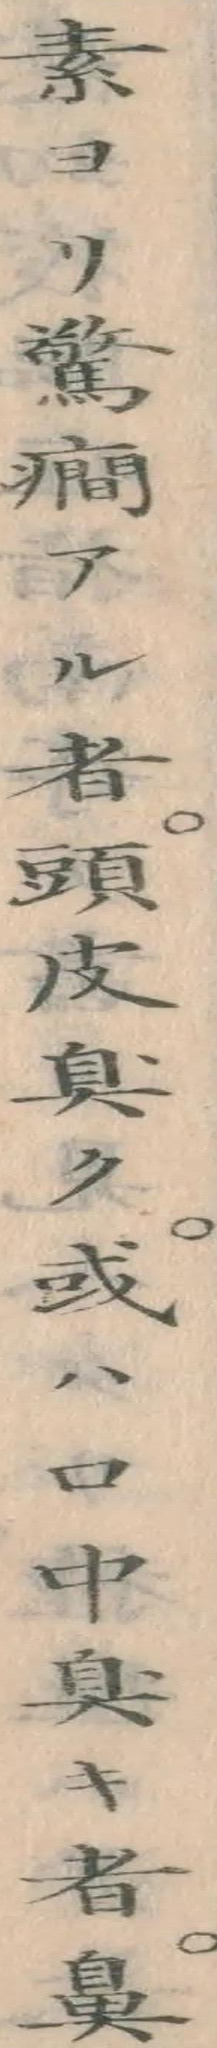素ヨリ驚癇アル者。頭皮臭ク。或ハ口中臭キ者。鼻
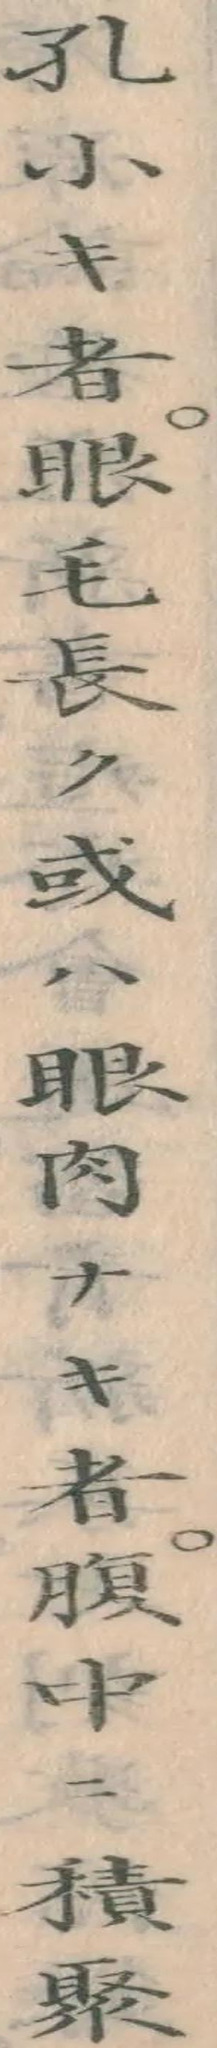孔小キ者。眼毛長ク或ハ眼肉ナキ者。腹中ニ積聚
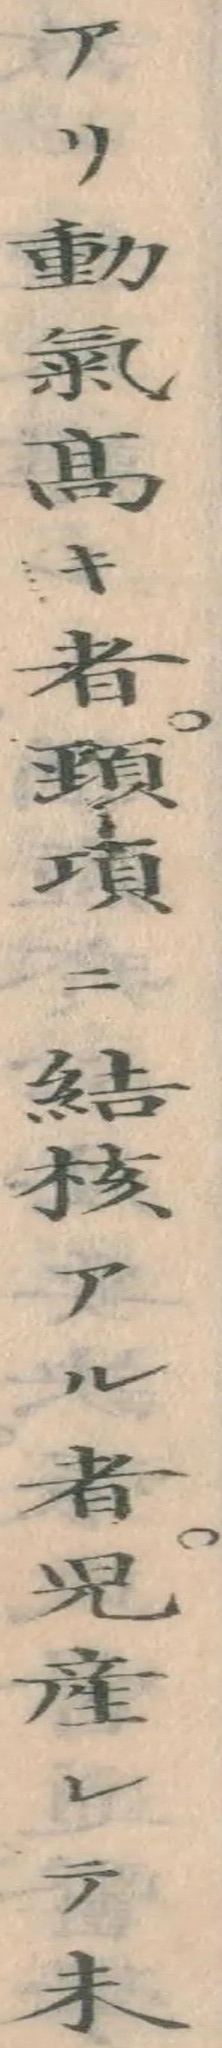アリ動気高キ者。頸項ニ結核アル者。児産レテ未
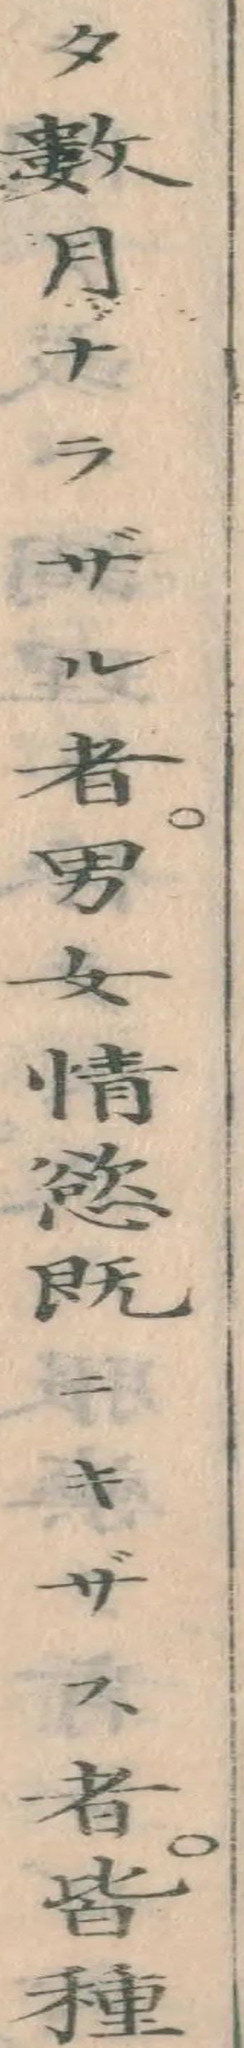タ数月ナラザル者。男女情慾既ニキザス者。皆種
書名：種痘弁義
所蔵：国立国会図書館 National Diet Library, JAPAN
